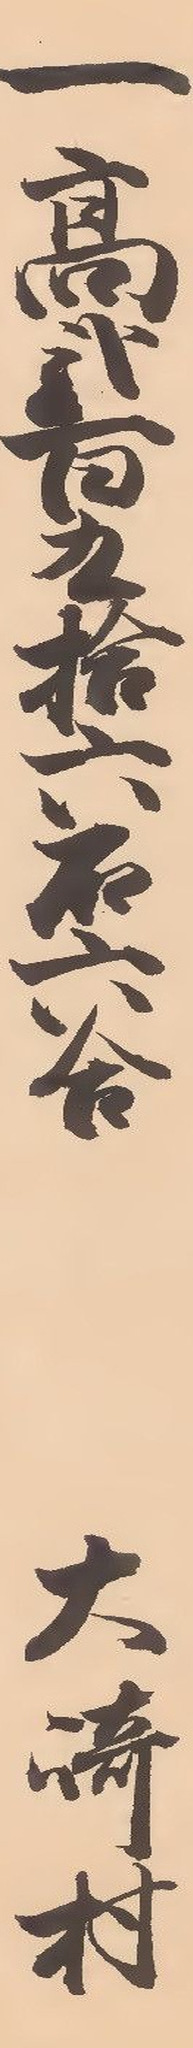一高弐百九拾六石六合大崎村
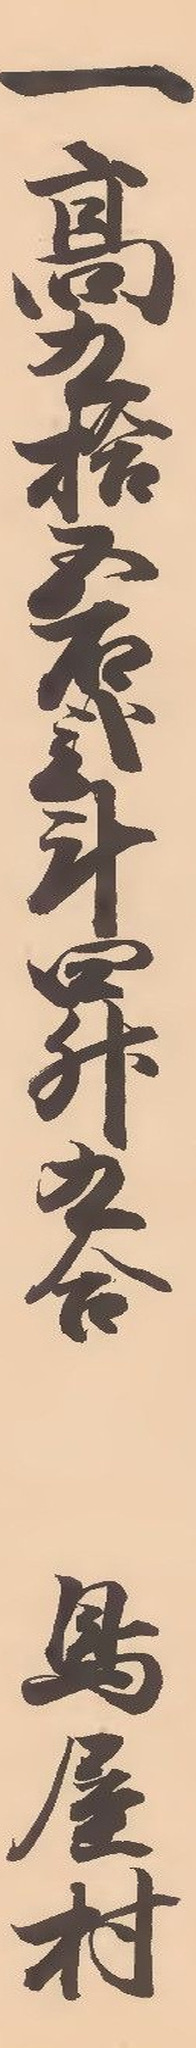一高九拾五石弐斗四升九合鳥屋村
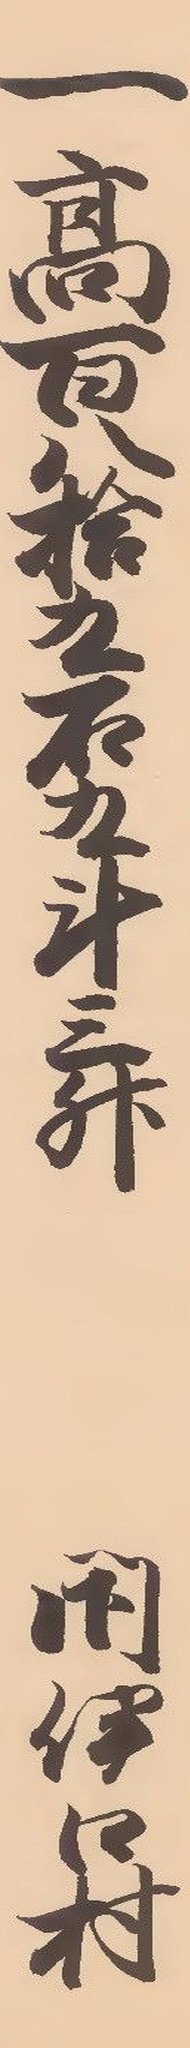一高百八拾九石九斗三升閉伊口村
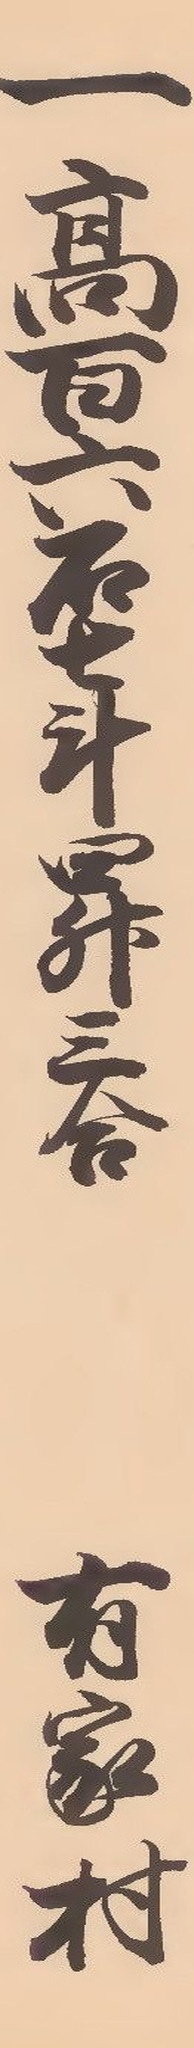一高百六石七斗四升三合有家村
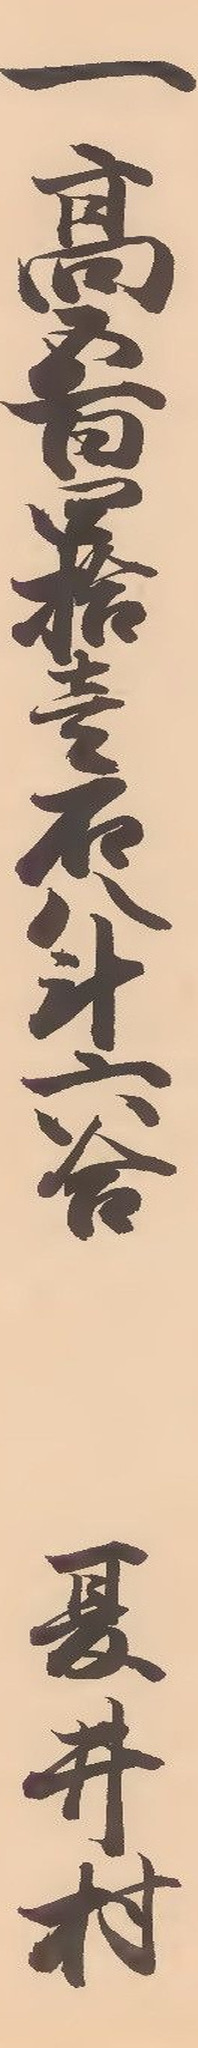一高五百四拾壱石八斗六合夏井村

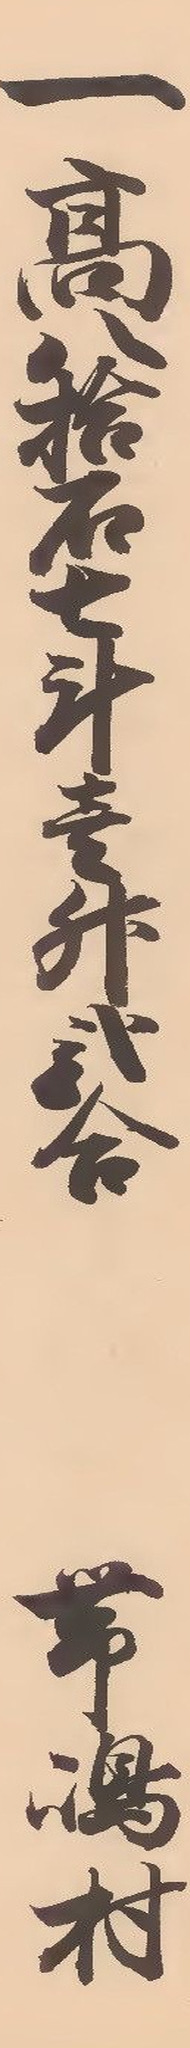一高八拾石七斗壱升弐合帯島村
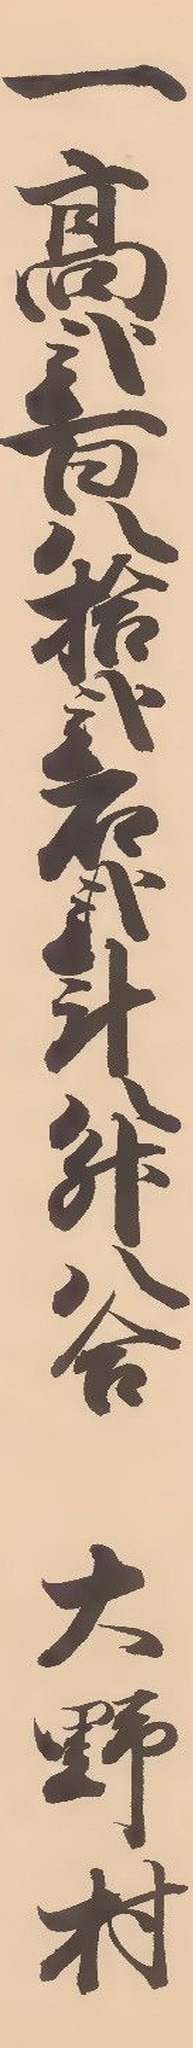一高弐百八拾弐石弐斗八升八合大野村
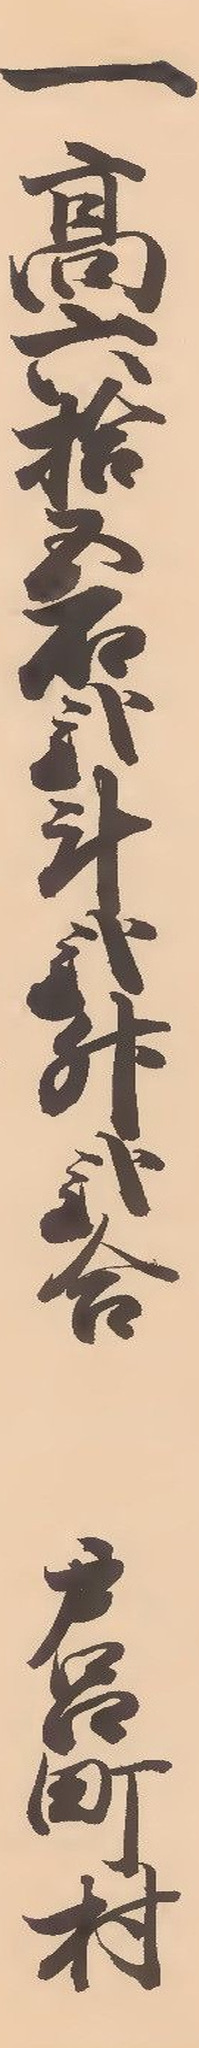一高六拾五石弐斗弐升弐合戸呂町村
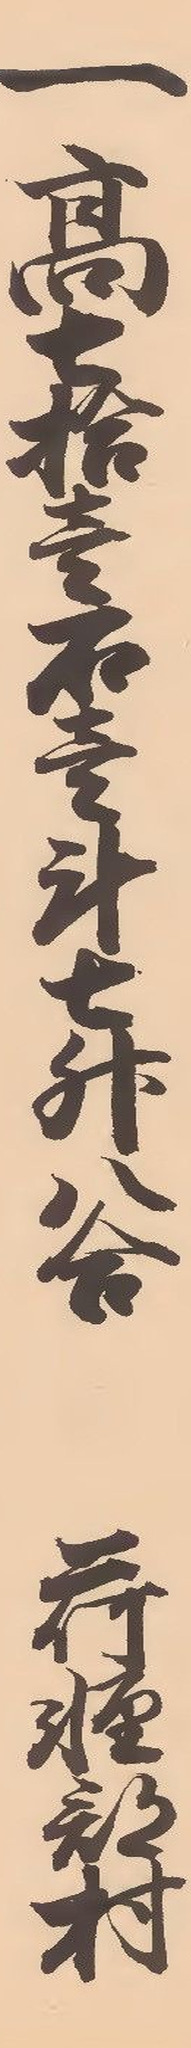一高七拾壱石壱斗七升八合荷軽部村
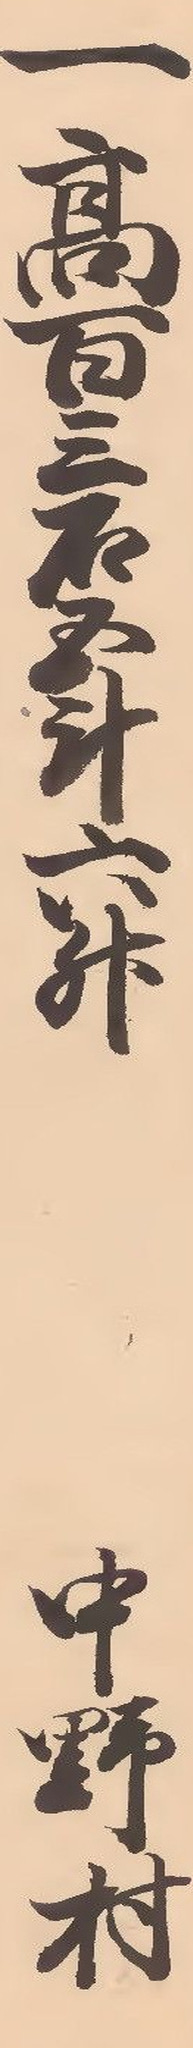一高百三石五斗六升中野村
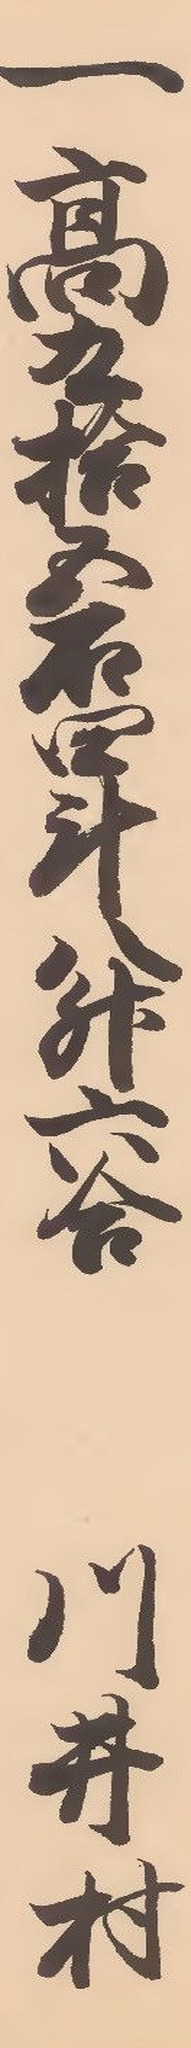一高九拾五石四斗八升六合川井村
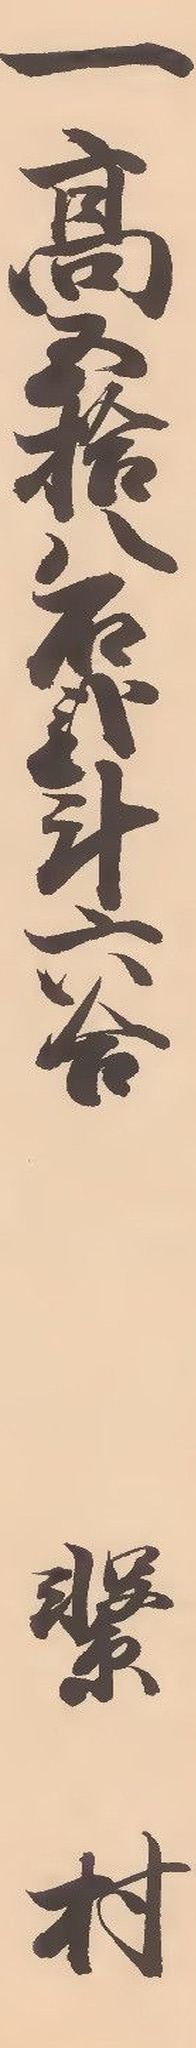一高五拾八石弐斗六合繋村
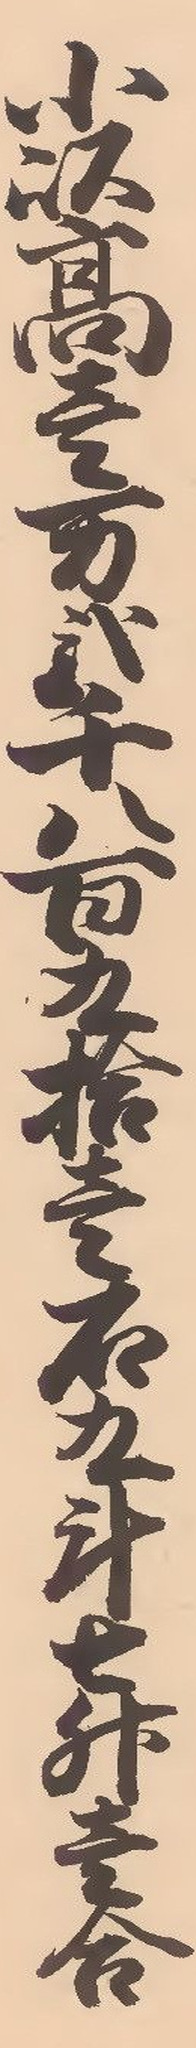小以高壱万弐千八百九拾壱石九斗七升壱合

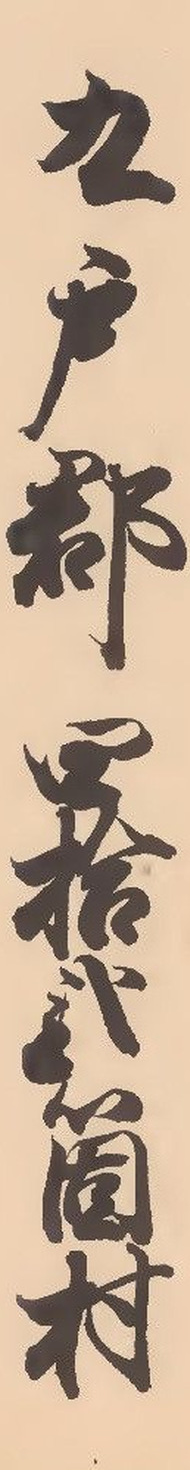九戸郡四拾弐箇村
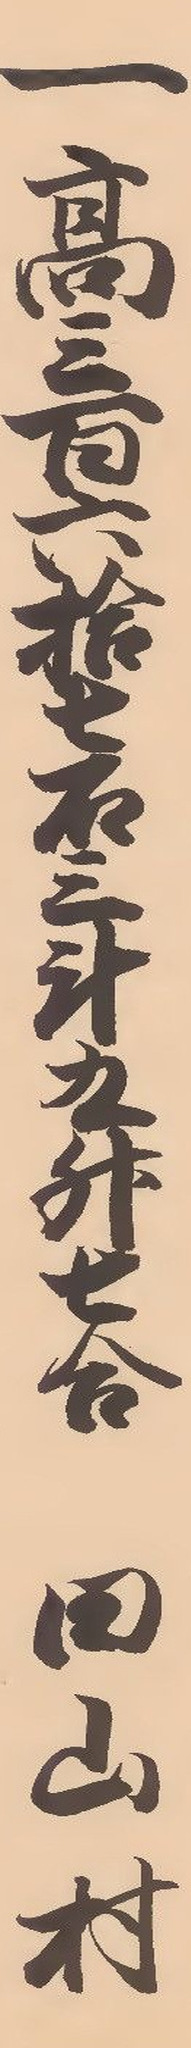一高三百六拾七石三斗九升七合田山村
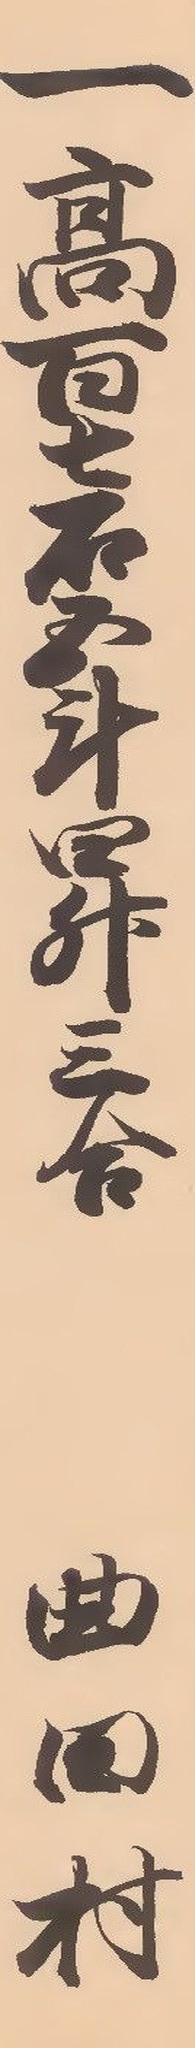一高百七石五斗四升三合曲田村
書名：陸奥国郷帳　６
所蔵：国立公文書館 National Archives of Japan
